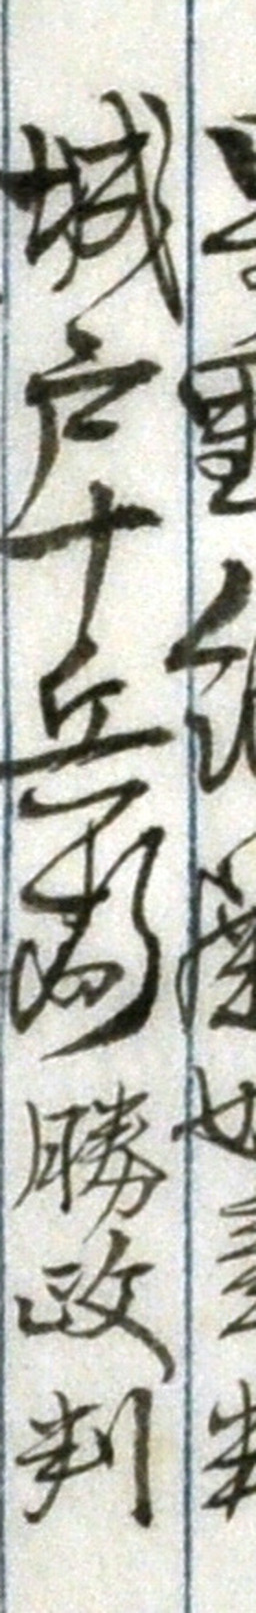城戸十兵衛勝政判
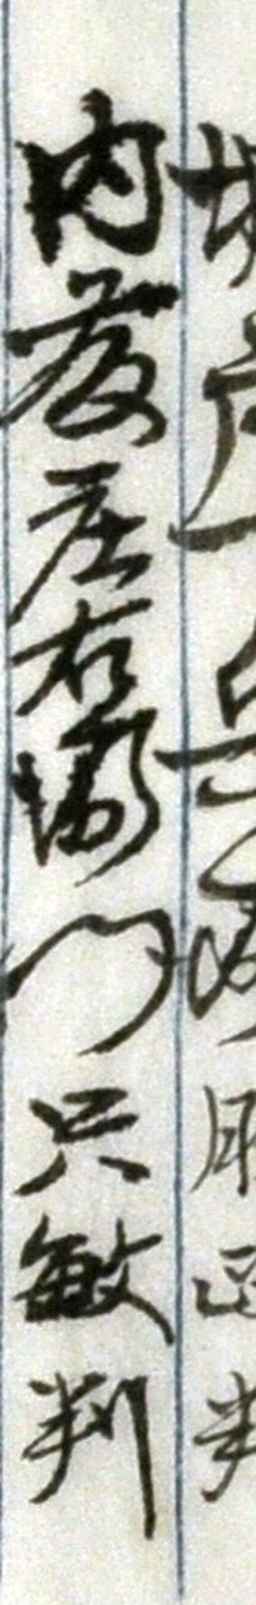内藤庄右衛門只敏判
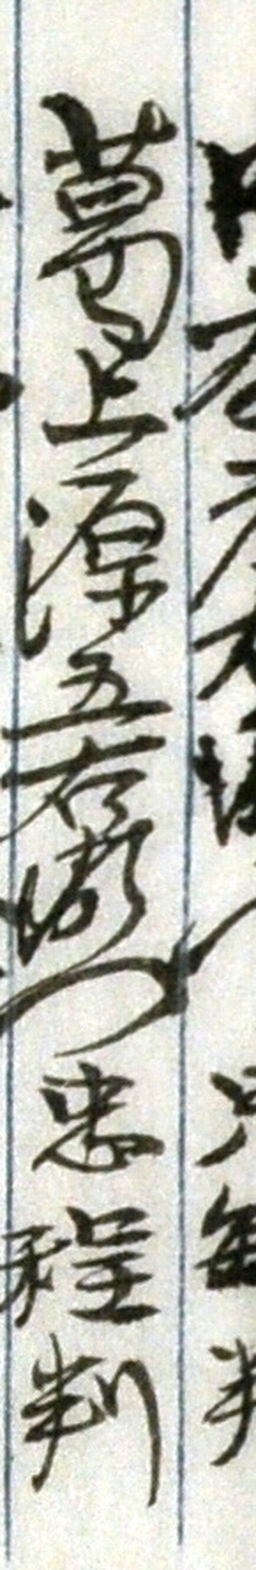葛上源五右衛門忠程判
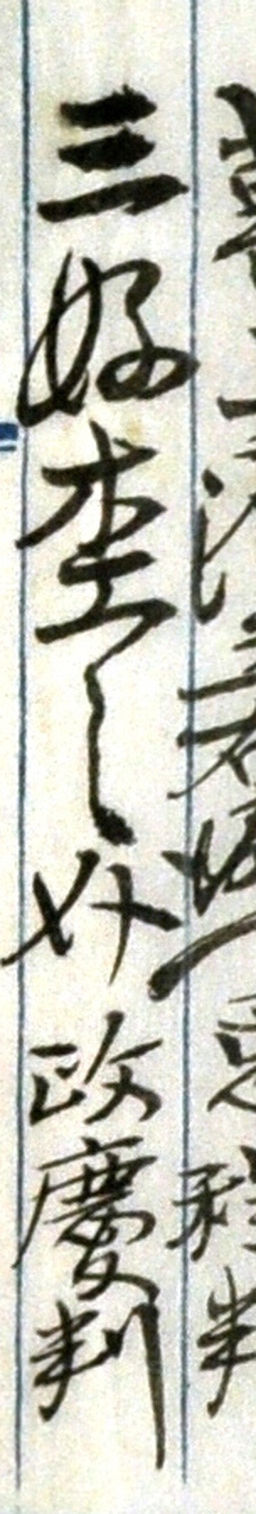三好杢之介政慶判
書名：仰書覚
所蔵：伊那市立高遠町図書館・合同会社AMANE
